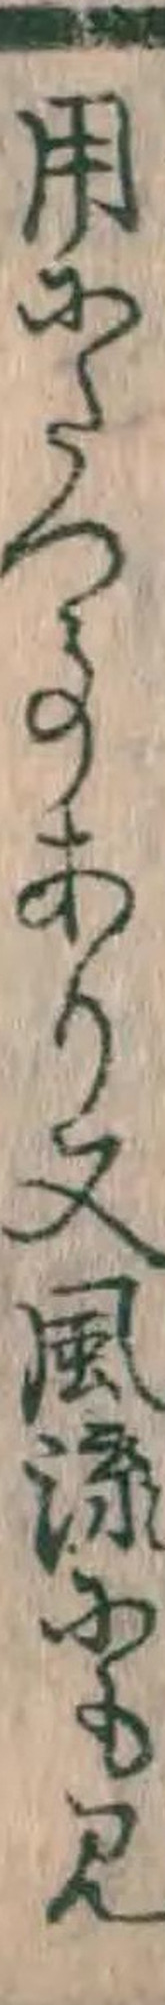用にたつ事あり又風流にも見
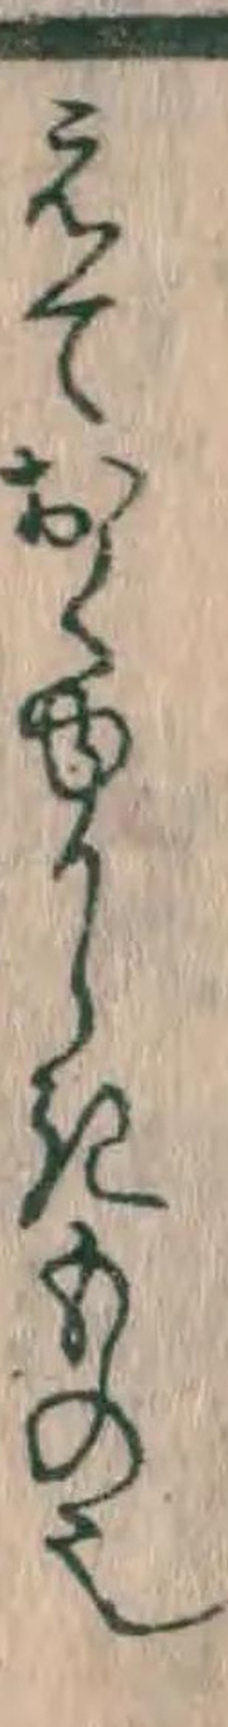えておくゆかしきもの也
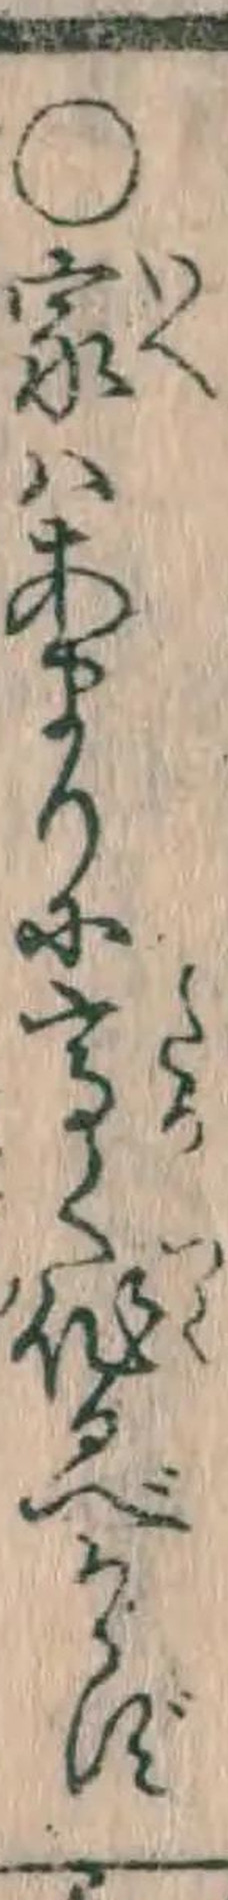○家はあまりに高く作るべからず
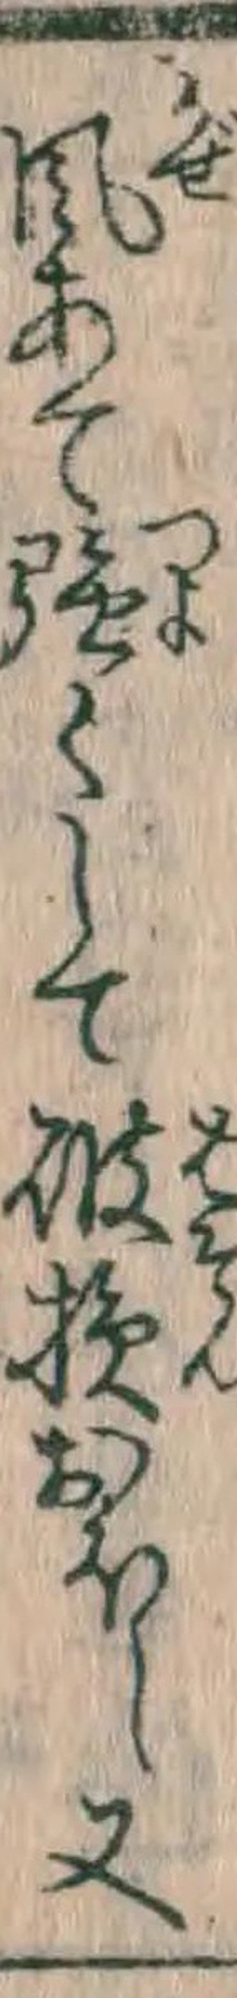風あて強くして破損おほし又
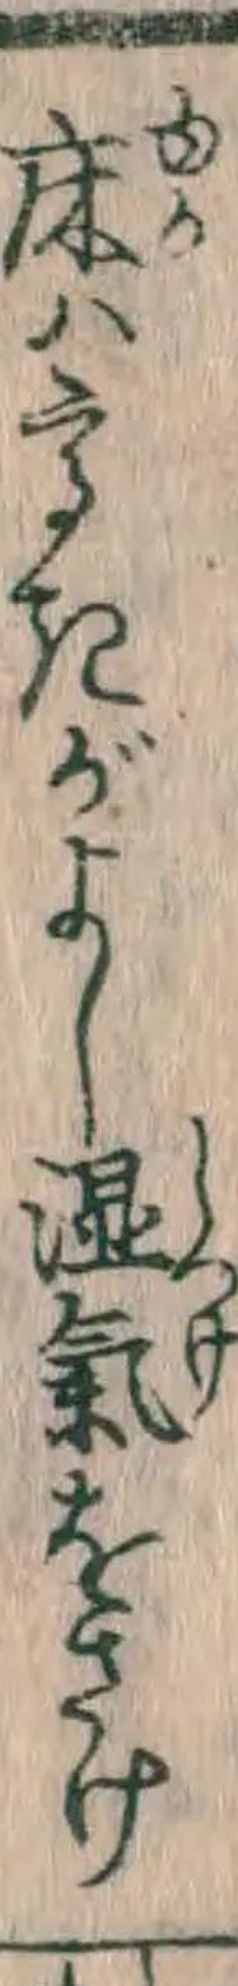床は高きがよし湿気をさけ
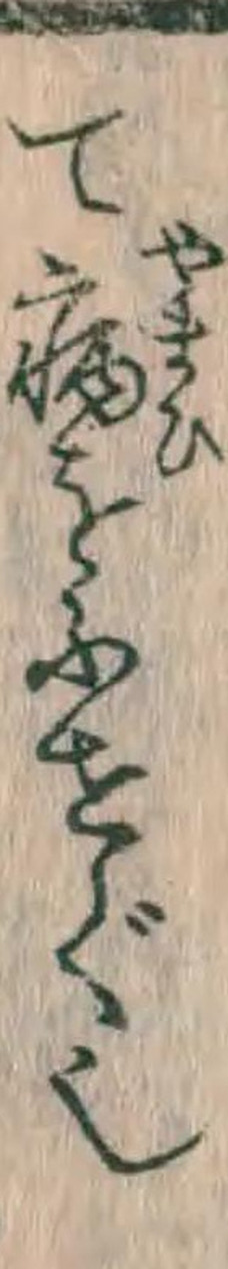て病をふせぐ也
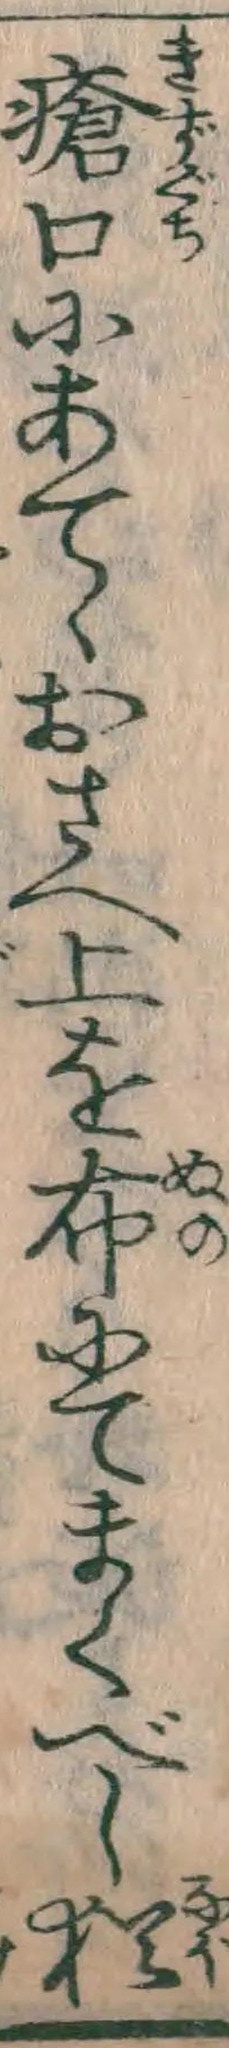瘡口にあてておさへ上を布にてまくべし猶
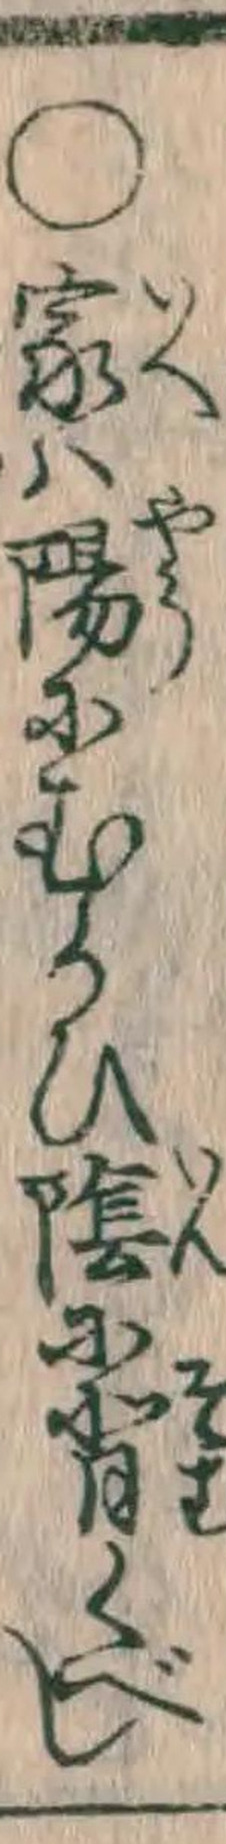○家は陽にむかひ陰に背くべし
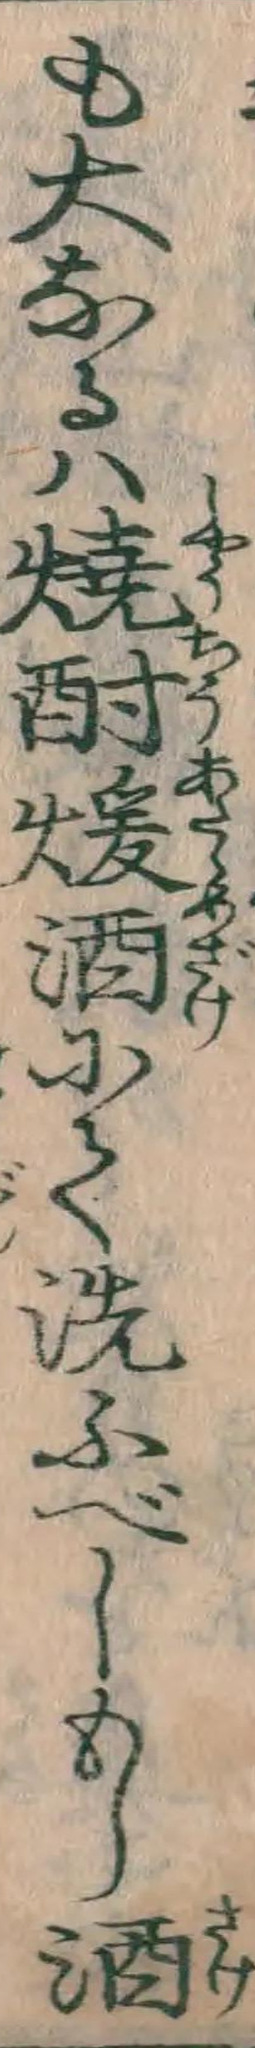も大なるは焼酎暖酒にて洗ふべしもし酒
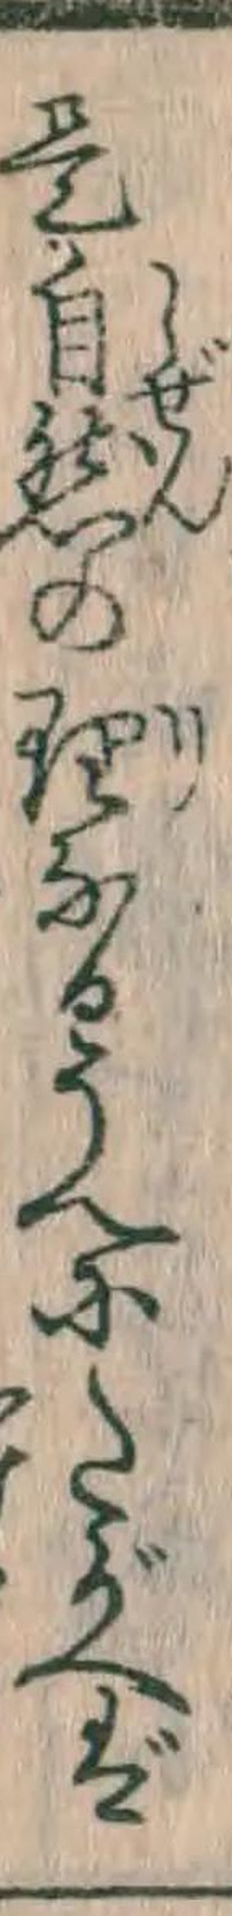是自然の理なるうへにたがへば
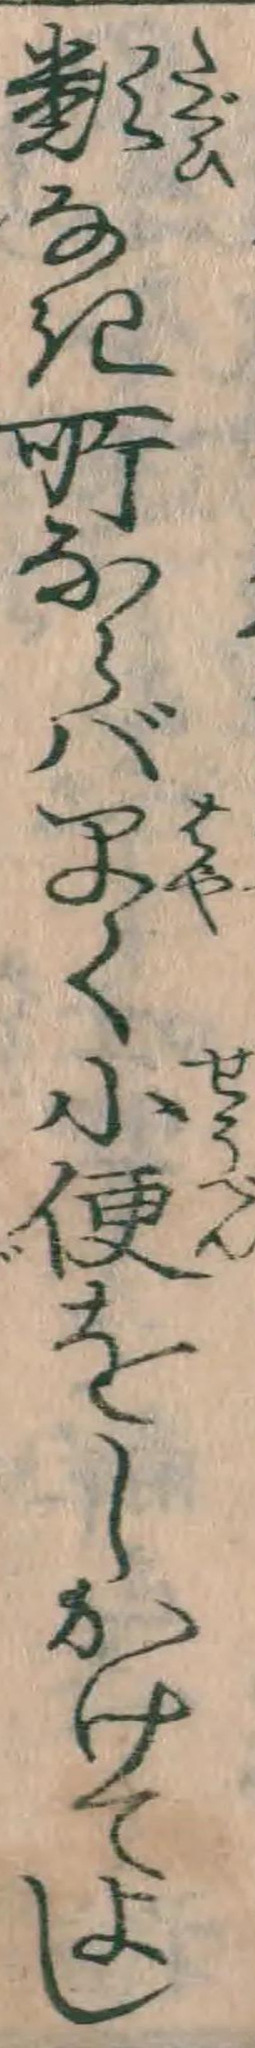類なき所ならば早く小便をしかけてよし
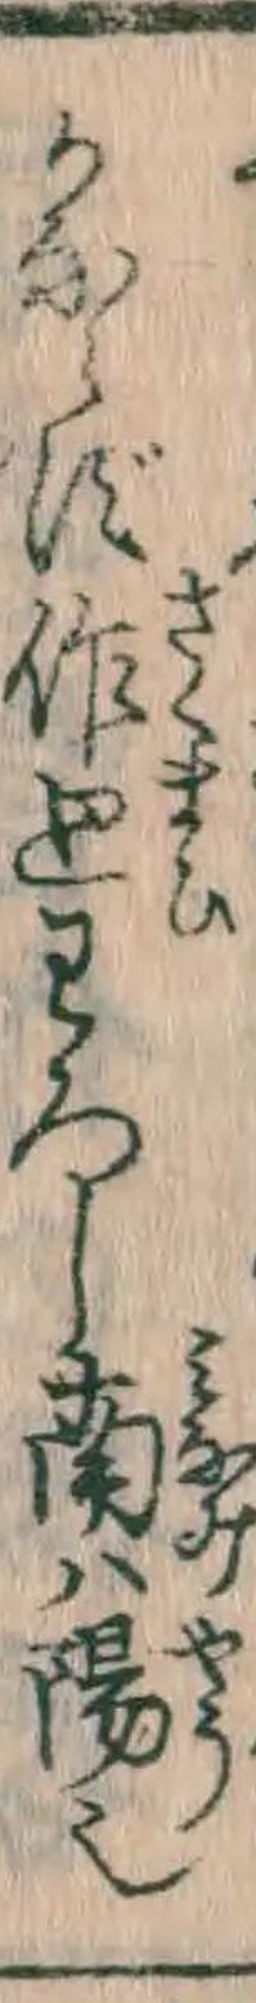かならず作廻わろし南は陽也
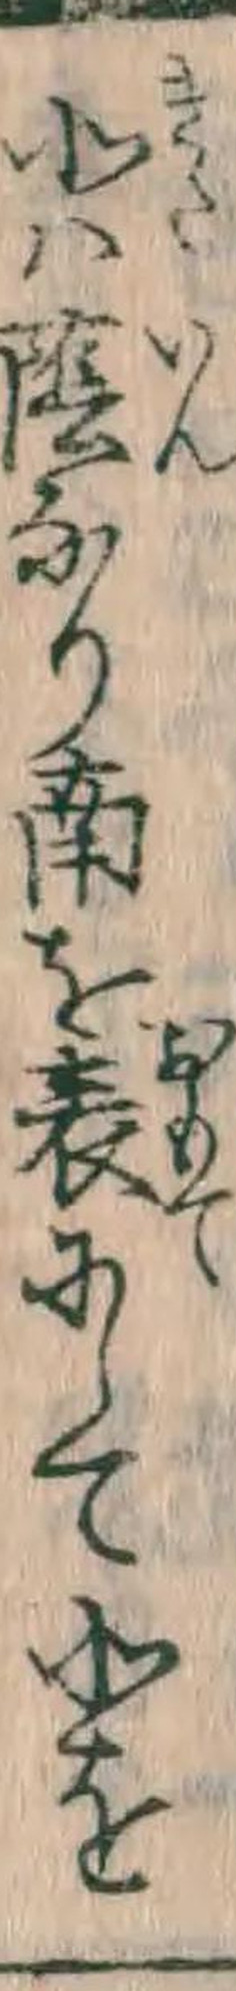北は陰なり南を表にして北を
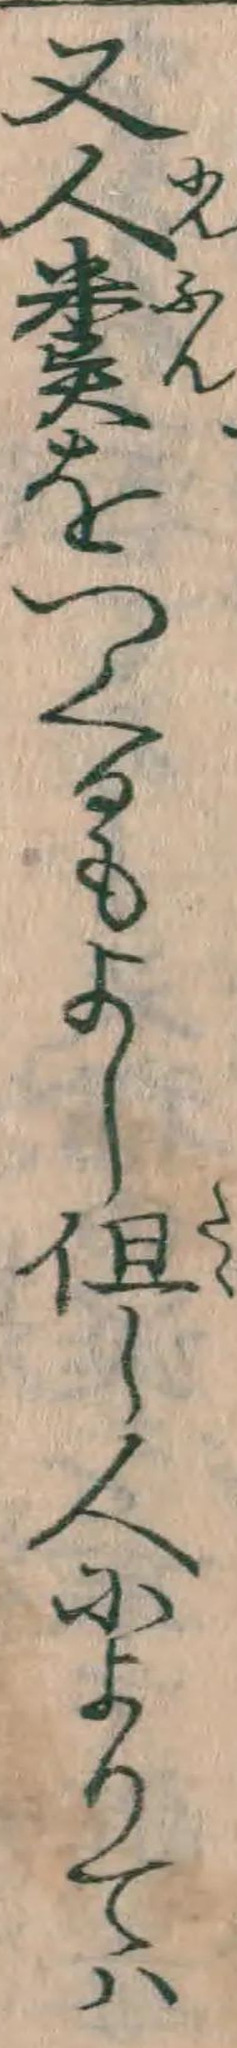又人糞をつくるもよし但し人によりては
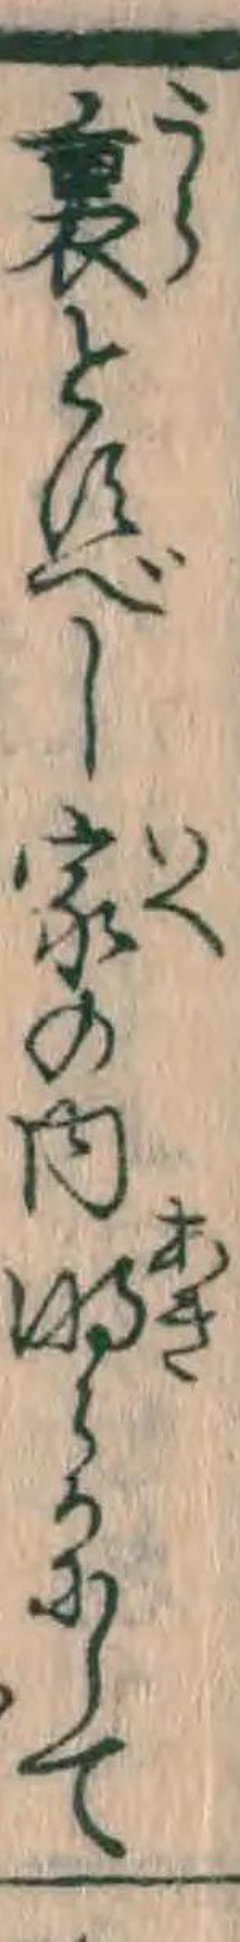裏とすべし家の内明らかにして
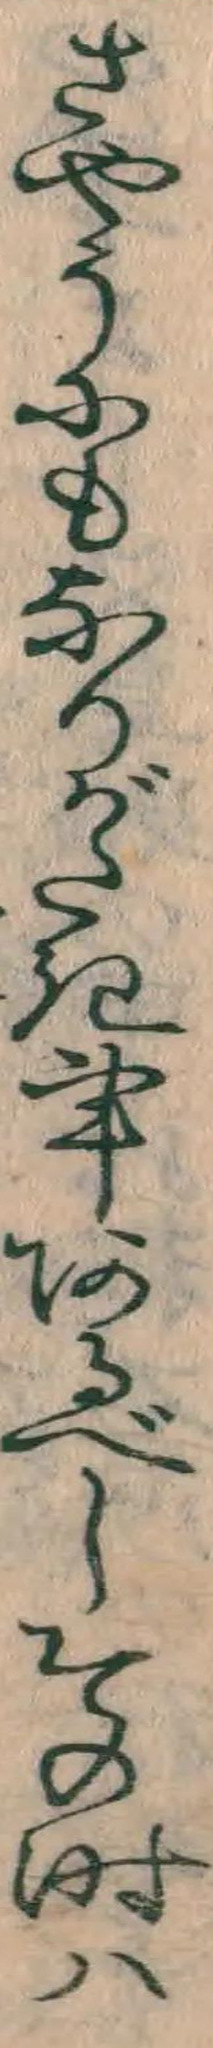さやうにもなりがたき事あるべしその時は
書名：広益秘事大全 3巻. [3]
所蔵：国立国会図書館 National Diet Library, JAPAN
